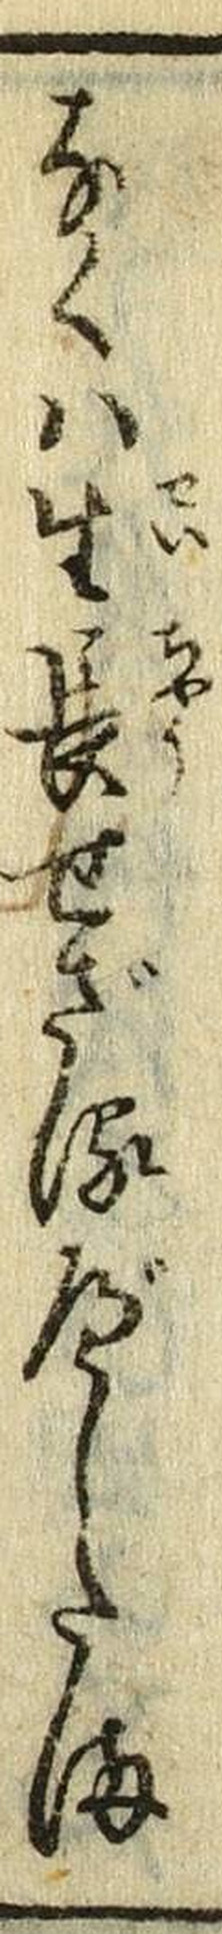なくは生長せざるべしたま
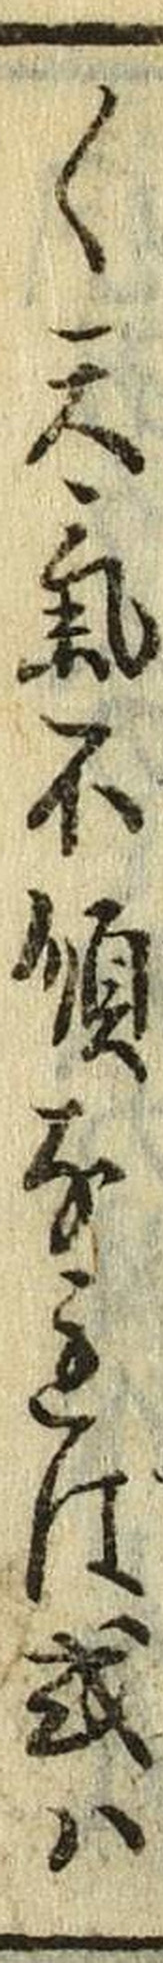〳〵天気不順なれば或は
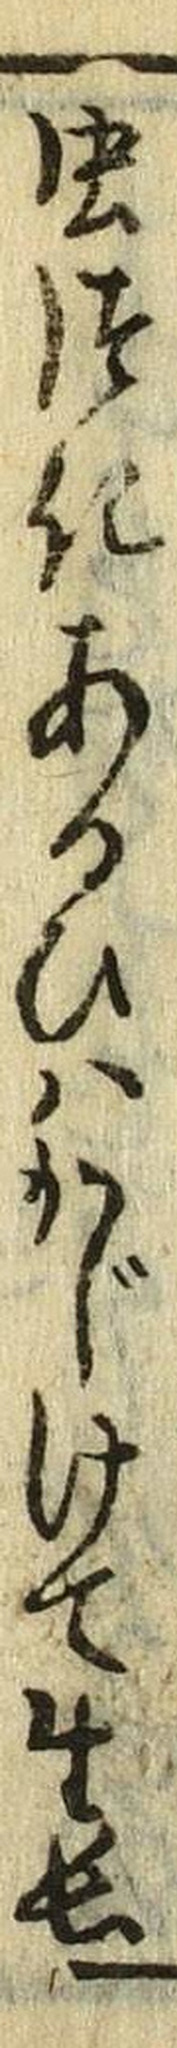虫つきあるひはかじけて生長
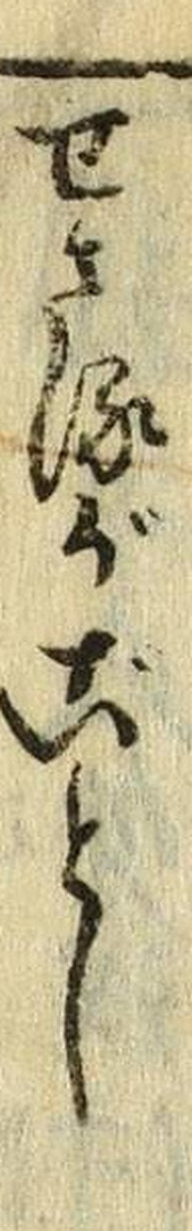せさるがごとし
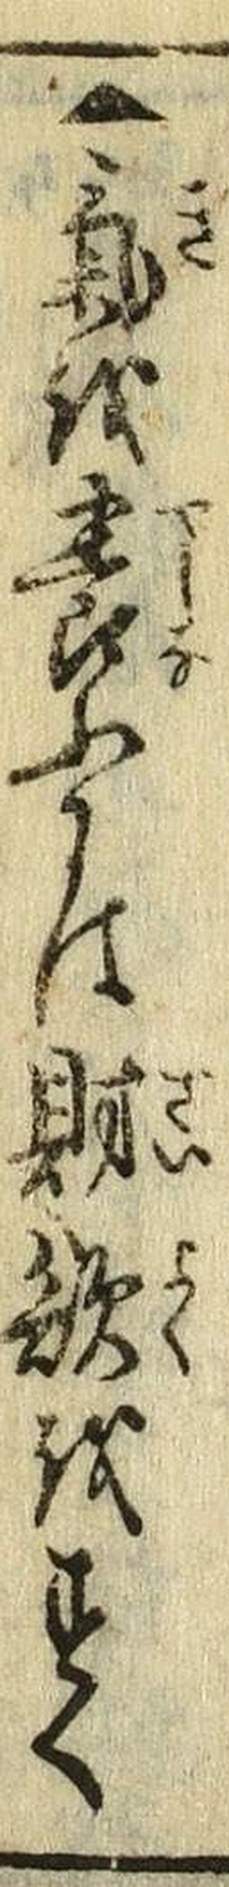▲気を養ふには財欲をすく
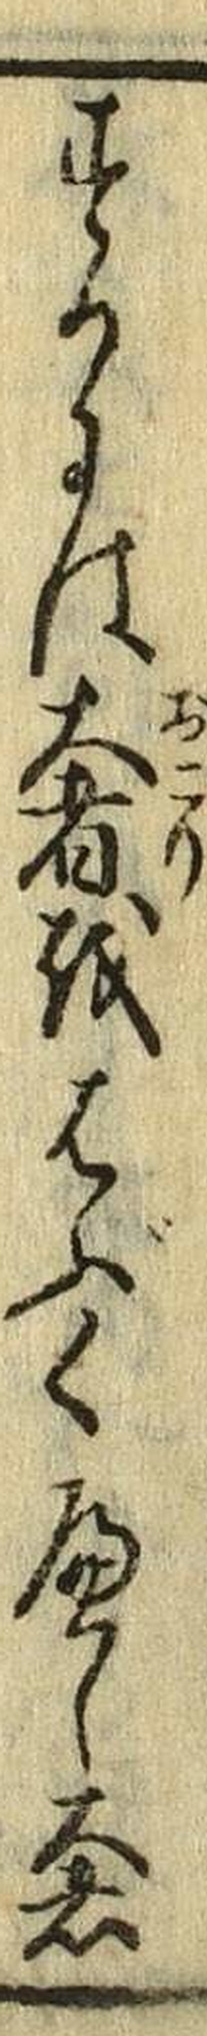するには奢をはぶくへし奢
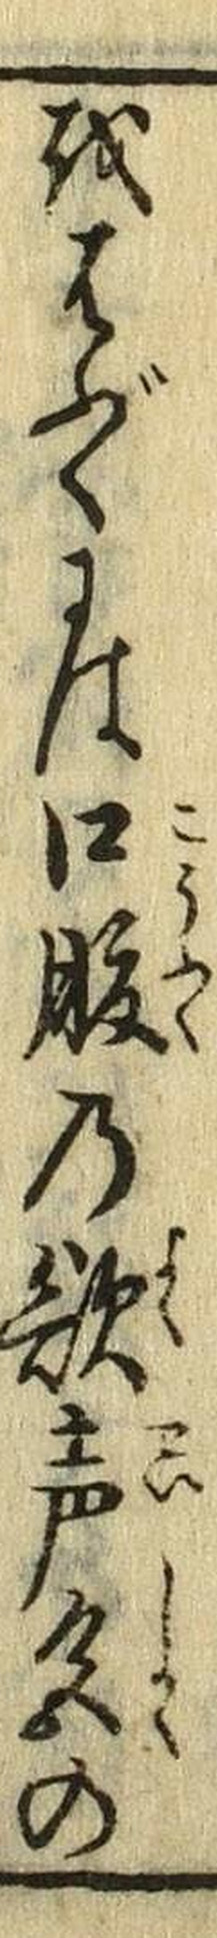をはぶくには口腹の欲声色の
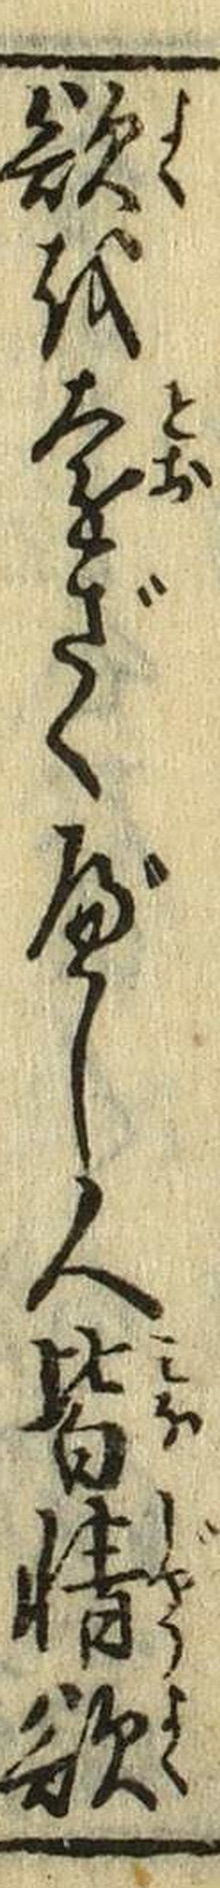欲を遠ざくべし人皆情欲
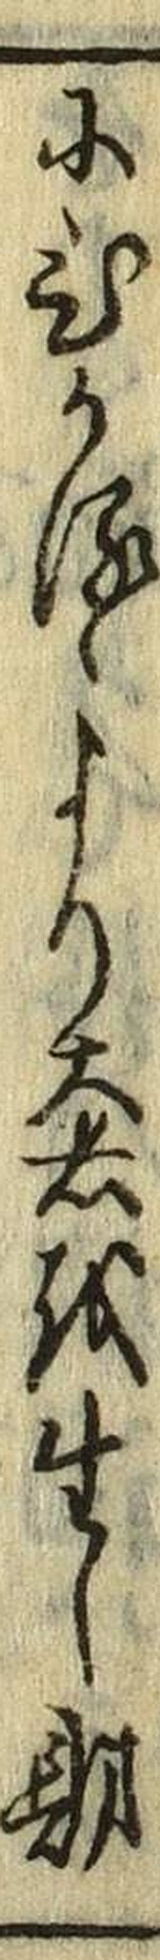にひかるゝより奢を生し財
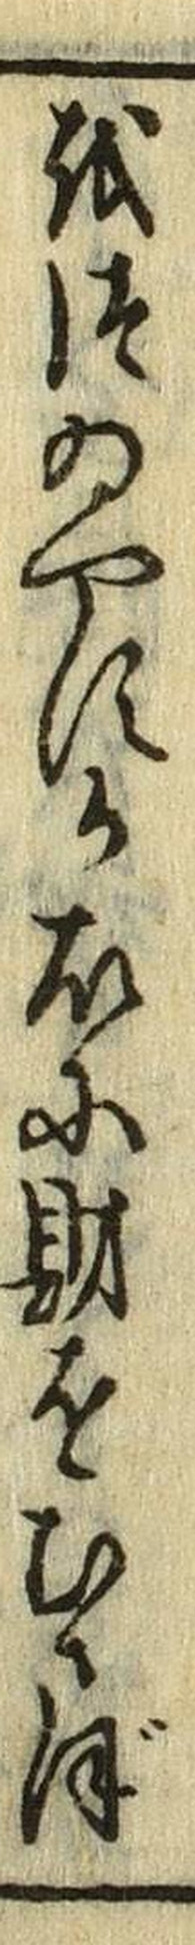をつゐやすか故に財をむさぼ
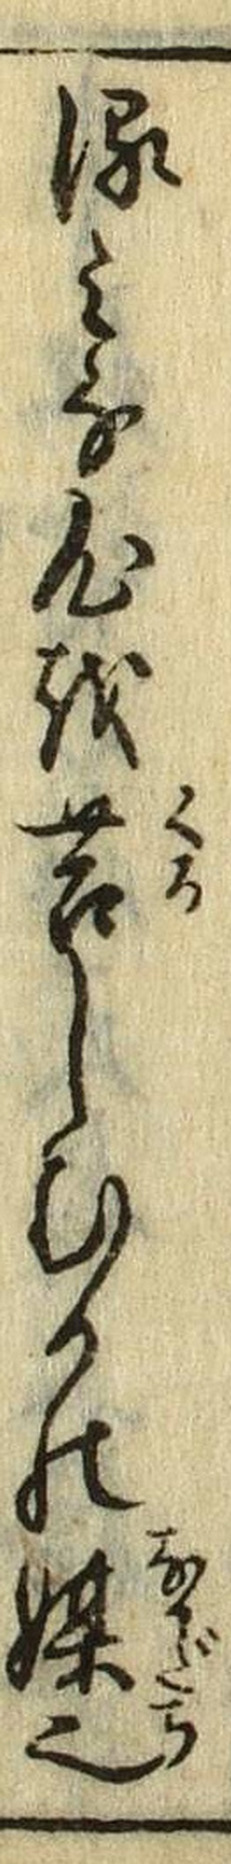るみな心を苦しむるの媒也
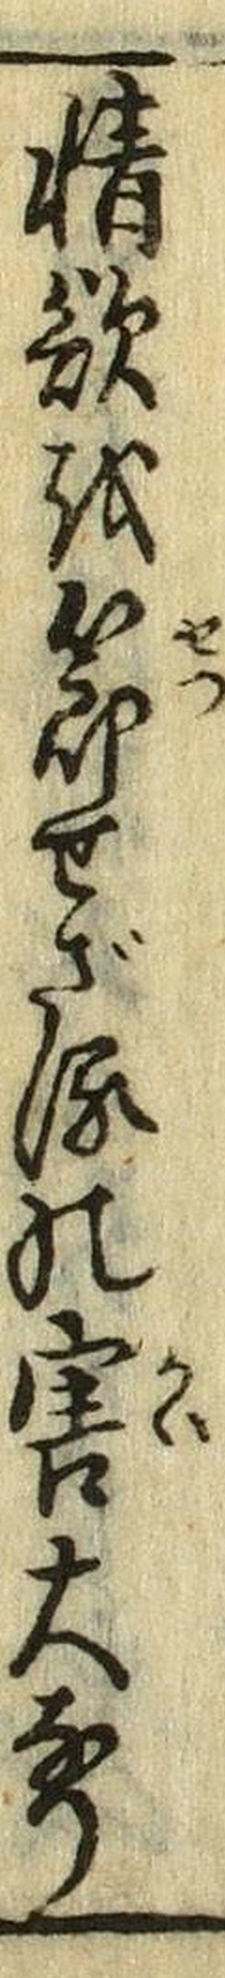情欲を節せざるの害大なり
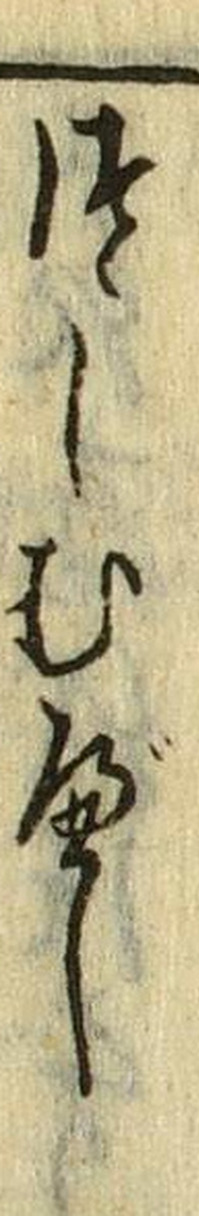つゝしむべし
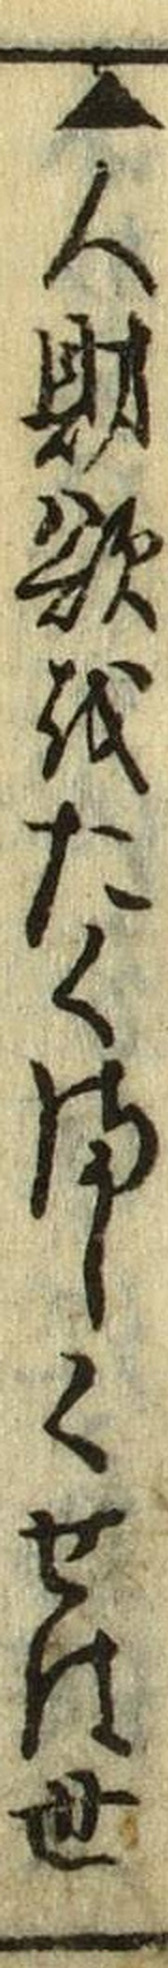▲人財欲をたくましくせは世
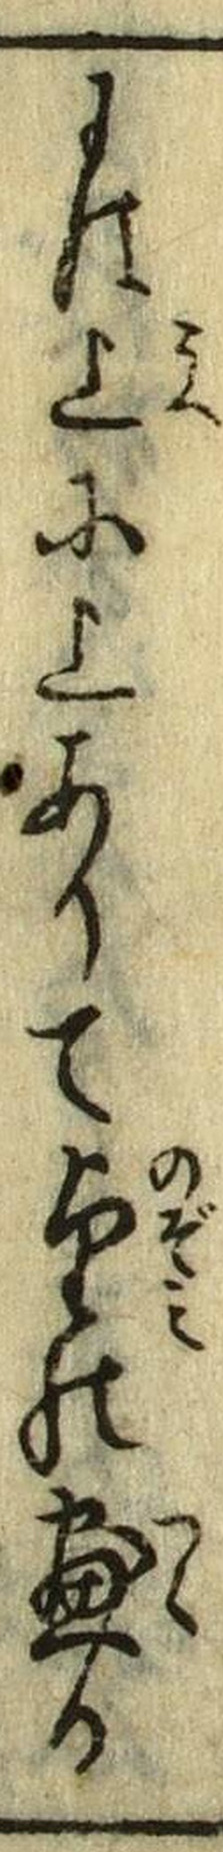には上に上ありて望の尽る
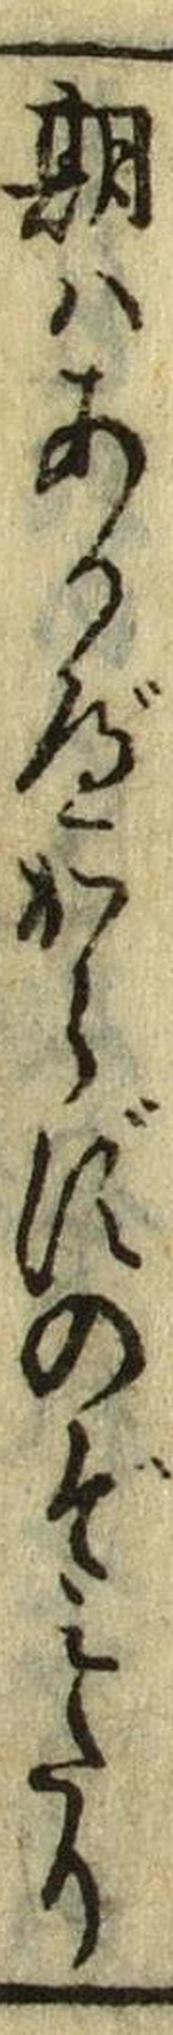期はあるべからずのぞみたり
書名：居家養生記
